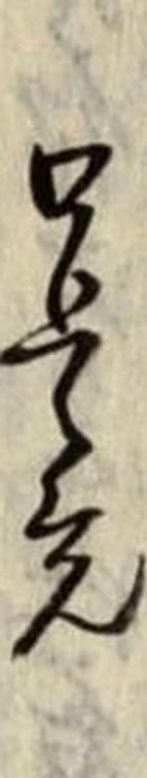口上之覚
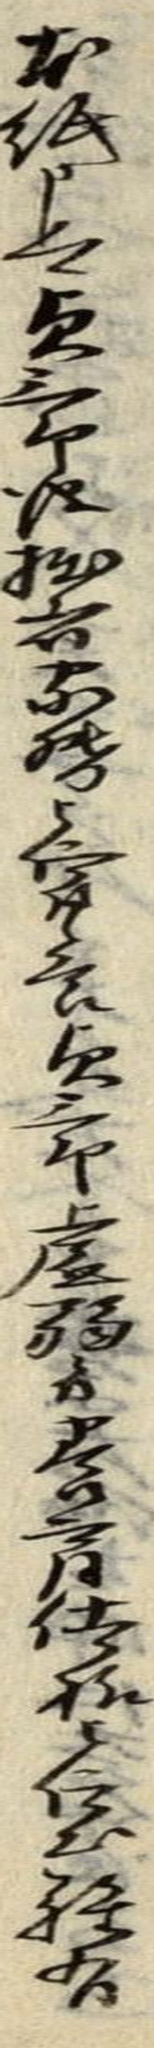本紙申上候貞三郎儀拙者家督被仰付候節貞三郎虚弱ニ付養育仕候様被仰出難有
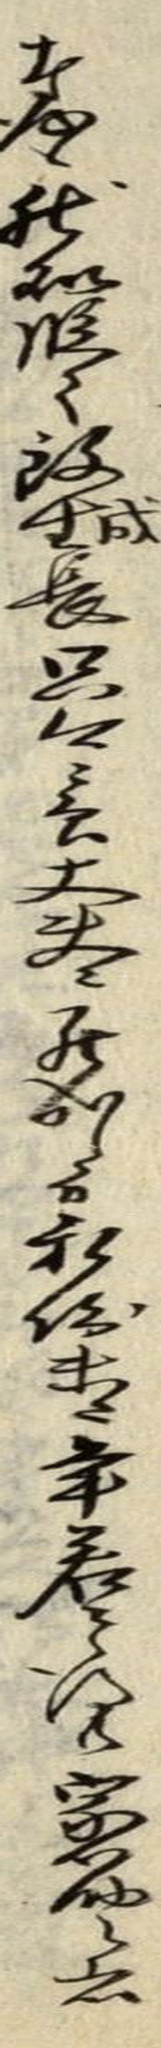奉存候然処段々致生長只今ニ而ハ丈夫ニ罷成候而私儀未た年若ニ候得共家筋之者
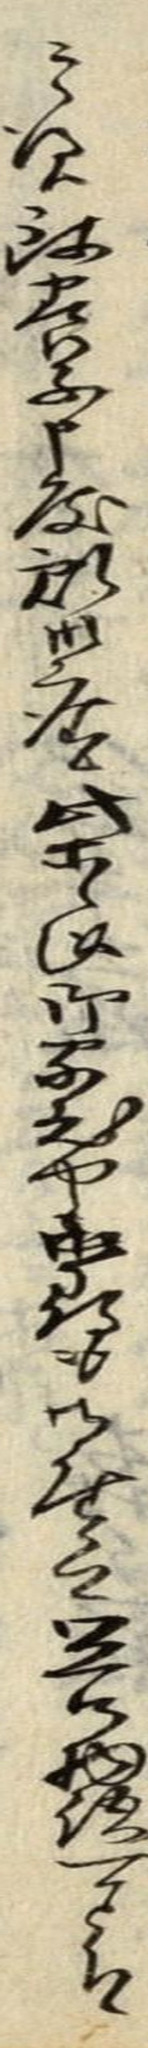ニ候得ハ致養子申度願御座候此等之趣御家老中御尋も御座候ハヽ宜御物語可被下候
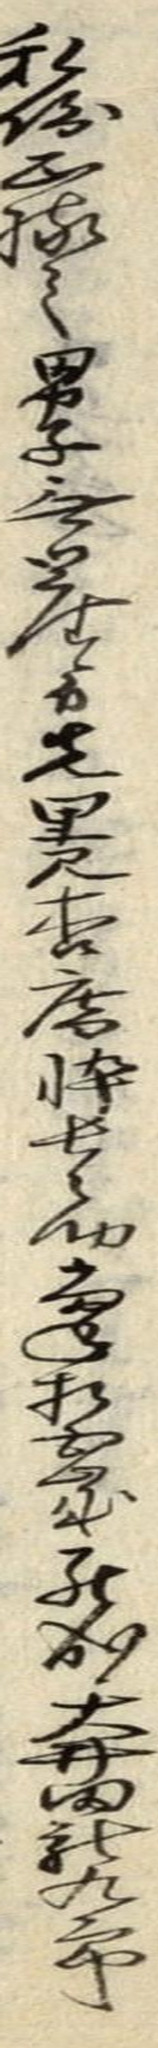私儀正縁之男子無御座候ニ付先里見杏庵忰長之助当年拾五歳罷成候大井田新九郎
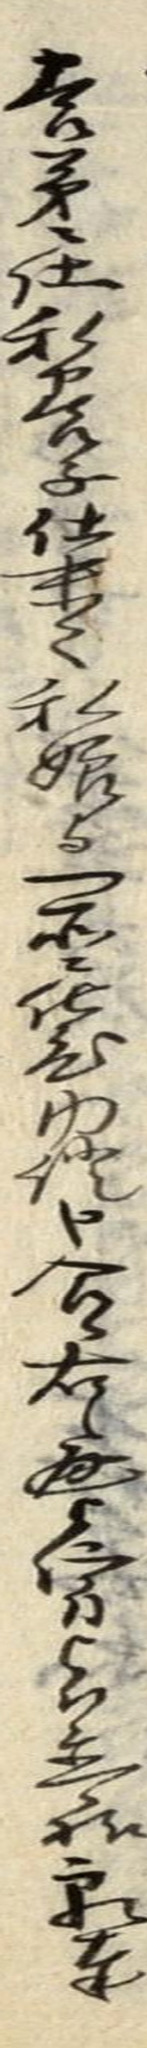養弟ニ仕私養子仕末々私娘与一所ニ仕度内証申合候右之通被仰付被下置候様願奉
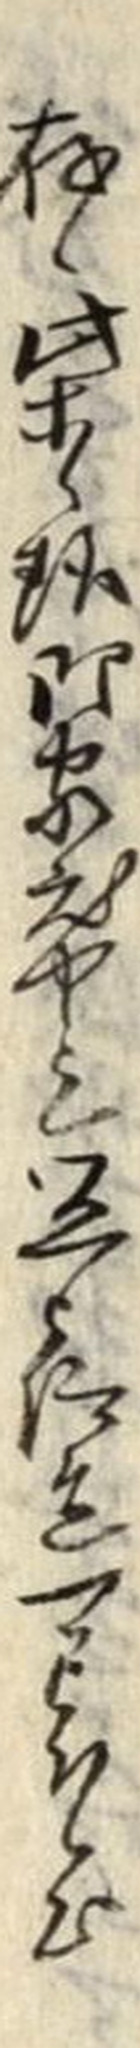存候此等之趣御家老中迄宜被仰達可被下候以上
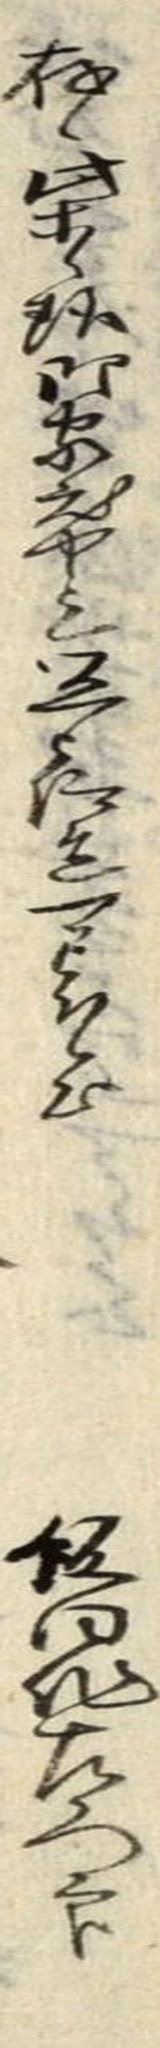存候此等之趣御家老中迄宜被仰達可被下候以上
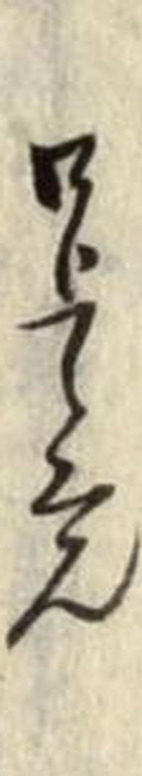口上之覚
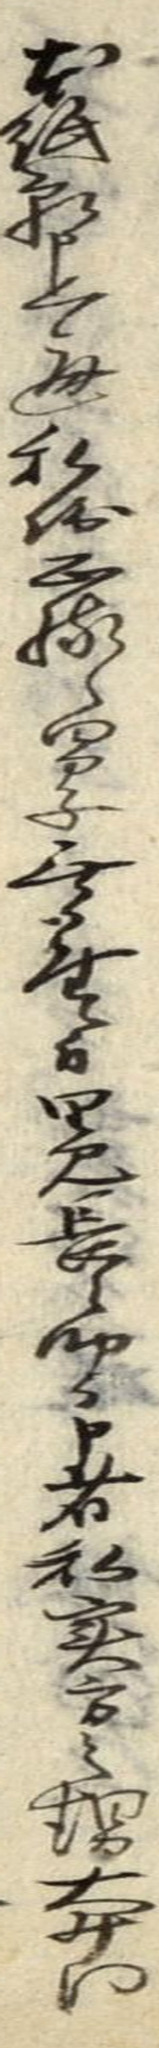本紙願申上候通私儀正縁之男子無御座候ニ付里見長之助与申者私実方之甥大井田
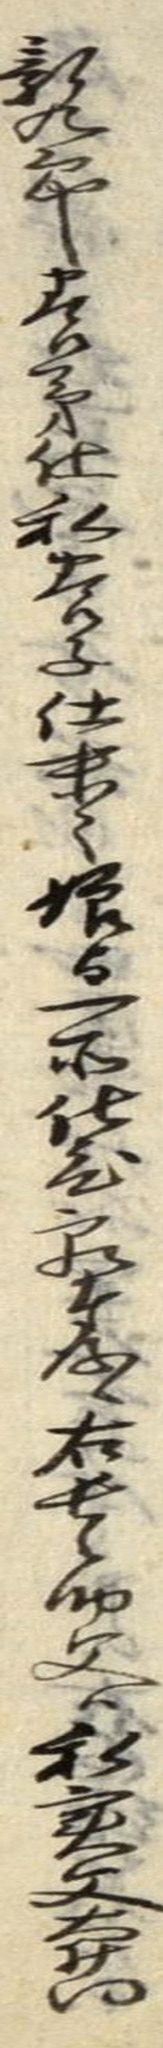新九郎養弟仕私養子仕末々娘与一所仕度願奉存候右長之助父ハ私実父大井田

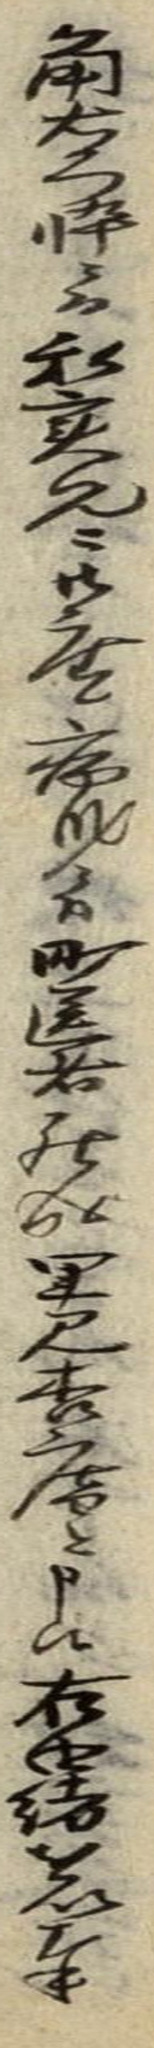角右衛門忰ニテ私実兄ニ御座候病身ニ付町医者罷成里見杏庵と申候右由緒を以奉
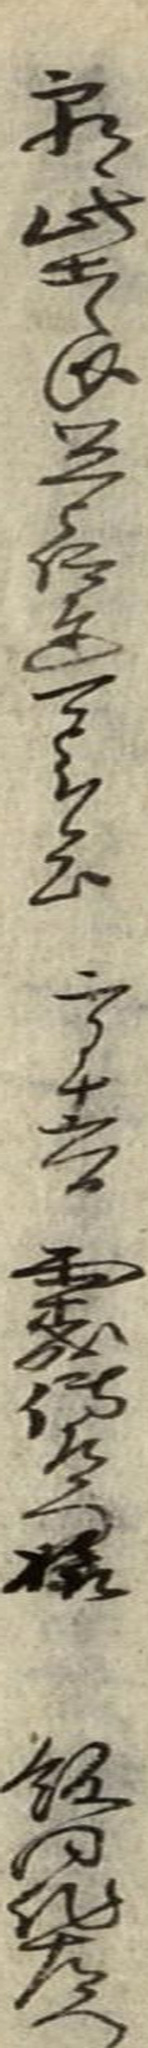願候此等之趣宜被仰達可被下候已上二月十六日雨森伝左衛門様飯田作左衛門
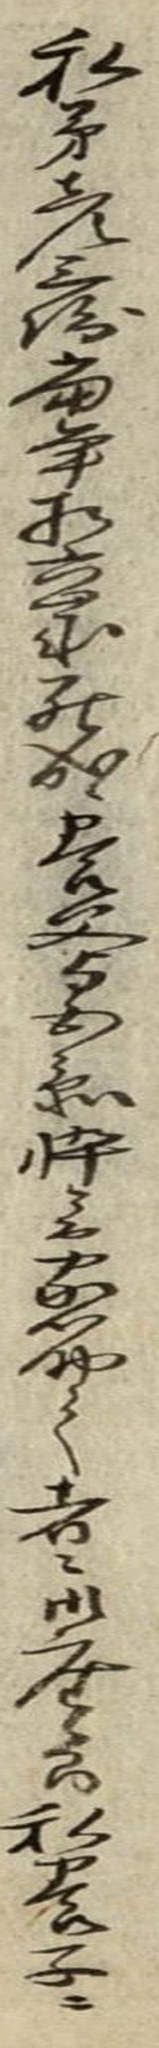私弟彦兵衛当年拾六歳罷成候養父与五兵衛忰ニテ家筋之者ニ御座候間私養子ニ
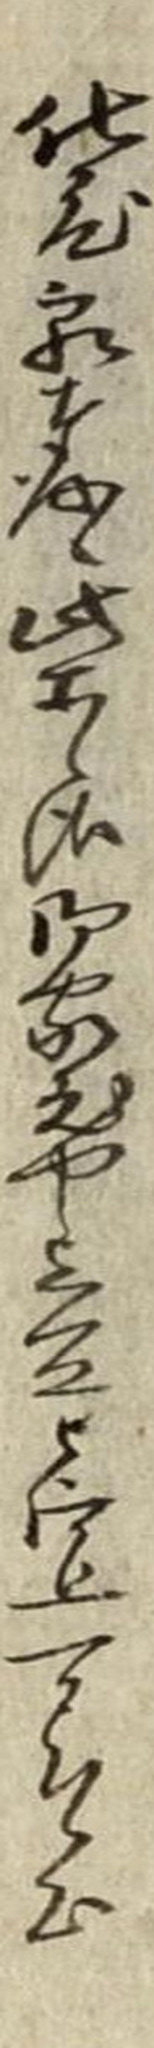仕度願奉存候此等之趣御家老中迄宜被仰上可被下候已上
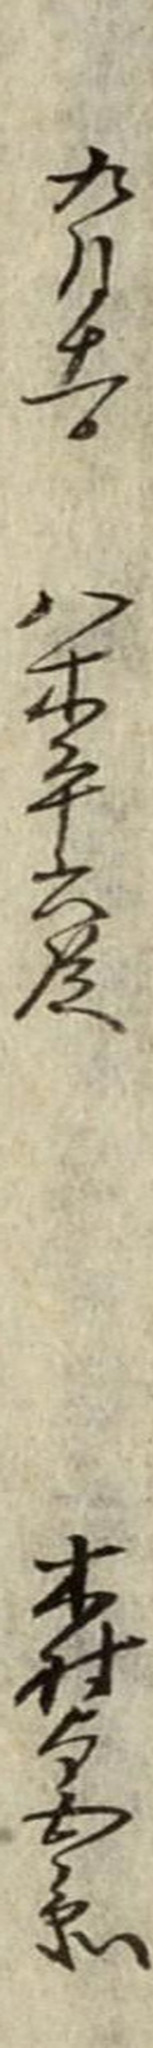九月十一日八木平六殿木村与五兵衛
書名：養子縁組之部
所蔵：福井県文書館 Fukui Prefectural Archives
